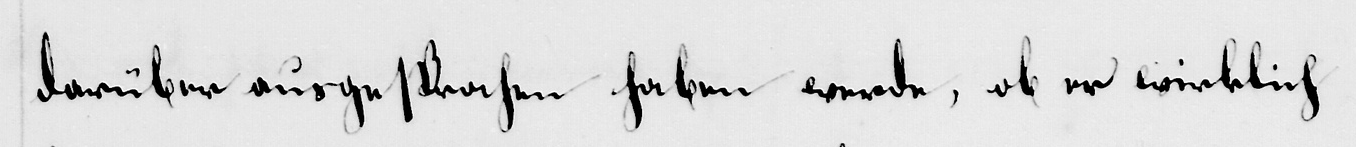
darüber ausgesprochen haben werde, ob er wirklich
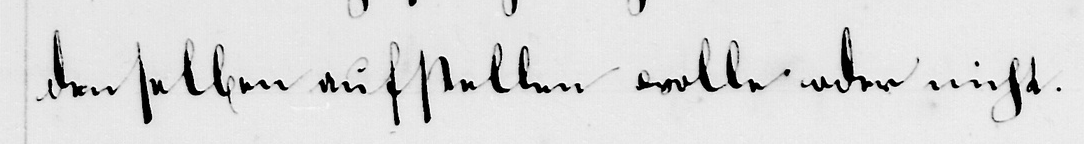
denselben aufstellen wolle oder nicht.
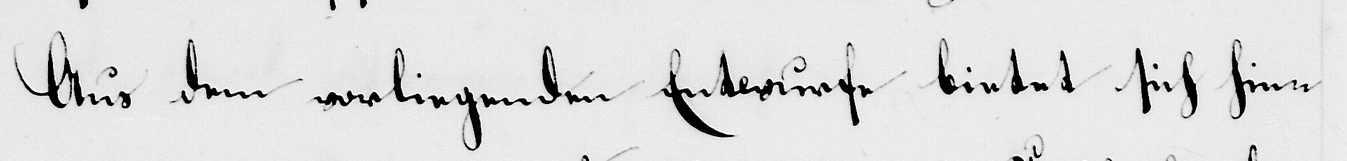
Aus dem vorliegenden Entwurfe bietet sich hin¬
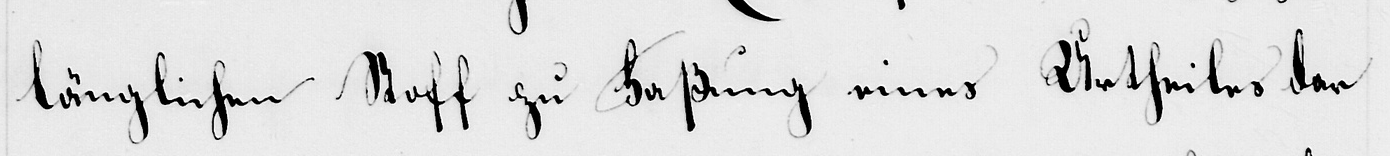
länglichen Stoff zu Faßung eines Urtheiles dar
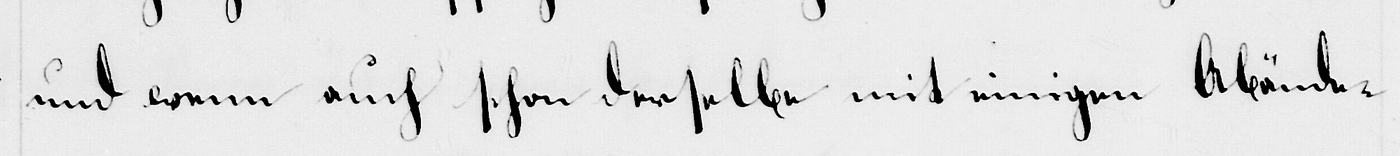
und wenn auch schon derselbe mit einigen Abände¬
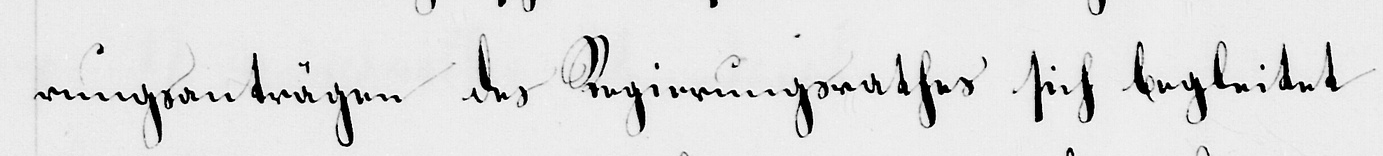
rungsanträgen des Regierungsrathes sich begleitet
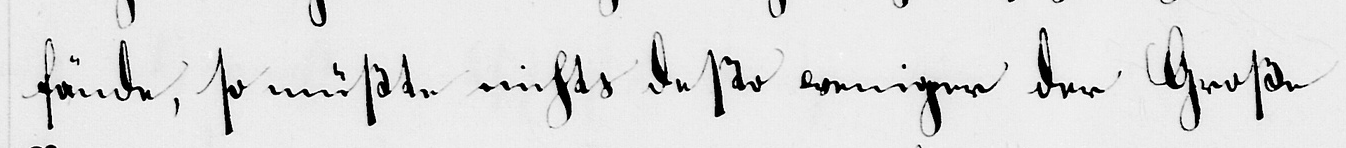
fände, so müßte nichts desto weniger der Große
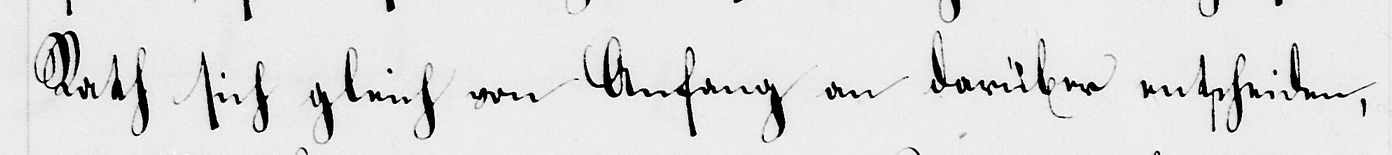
Rath sich gleich von Anfang an darüber entscheiden,
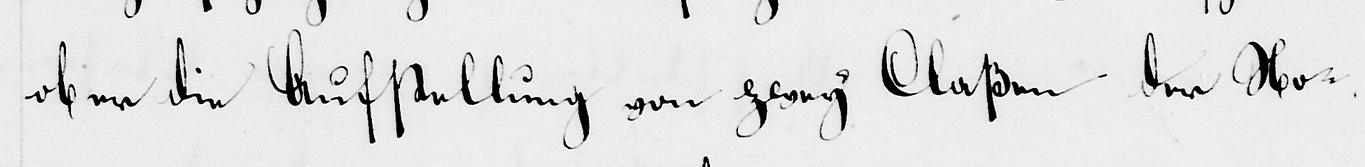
ob er die Aufstellung von zwey Claßen der No¬
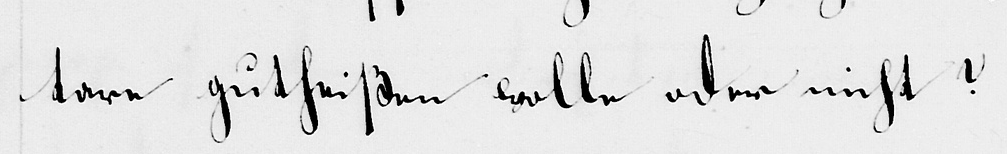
tare gutheißen wolle oder nicht?
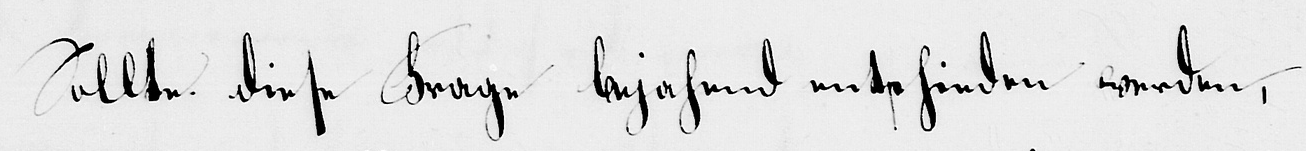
Sollte diese Frage bejahend entschieden werden,
